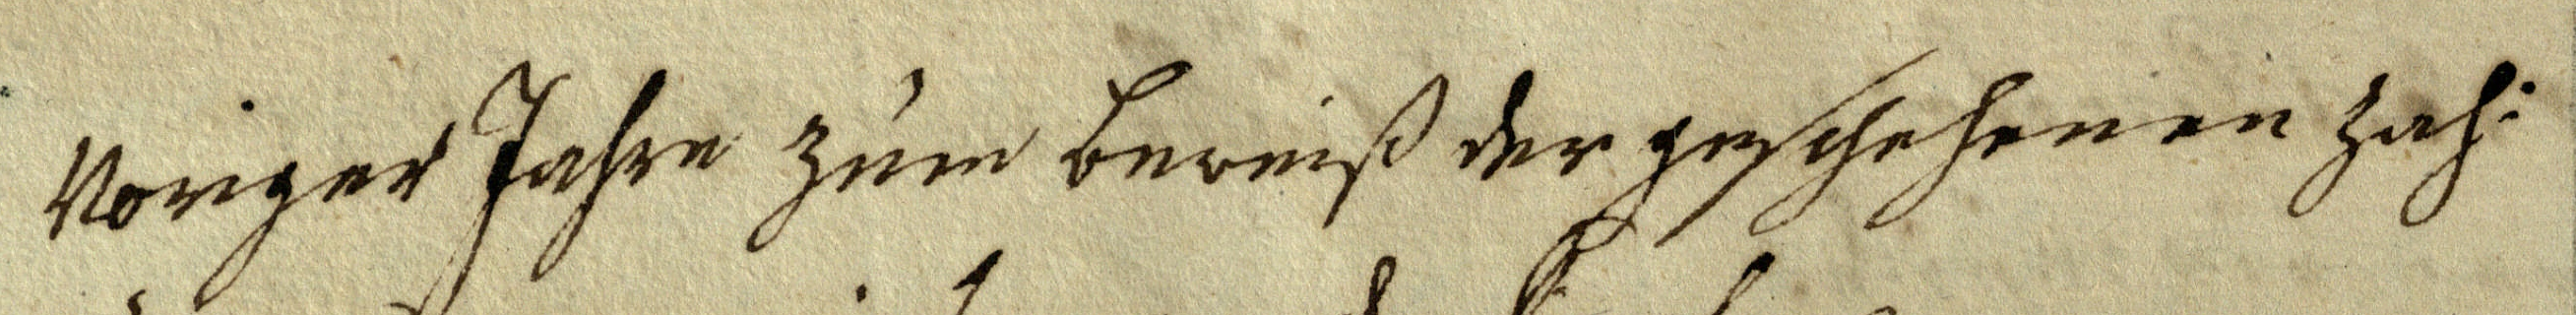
voriger Jahre zum Beweiß der geschehenen Zah¬
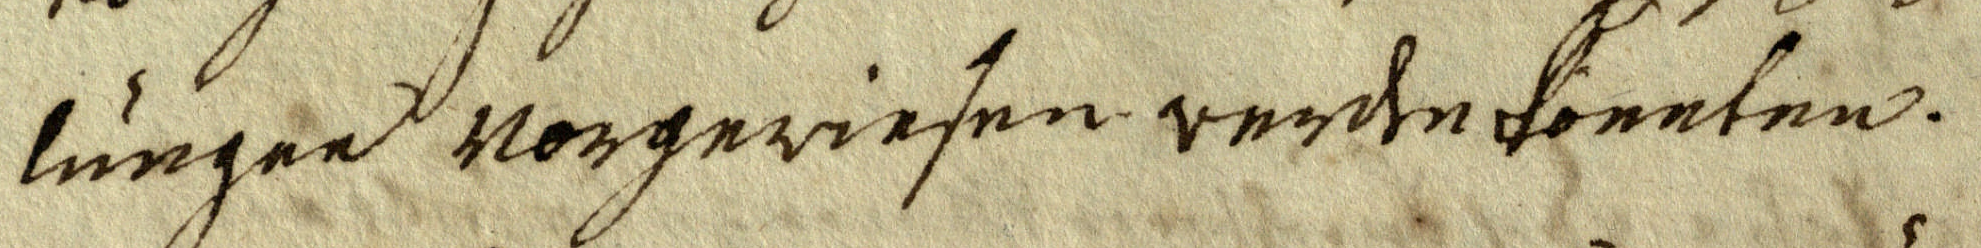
lungen vorgewiesen werden könnten.
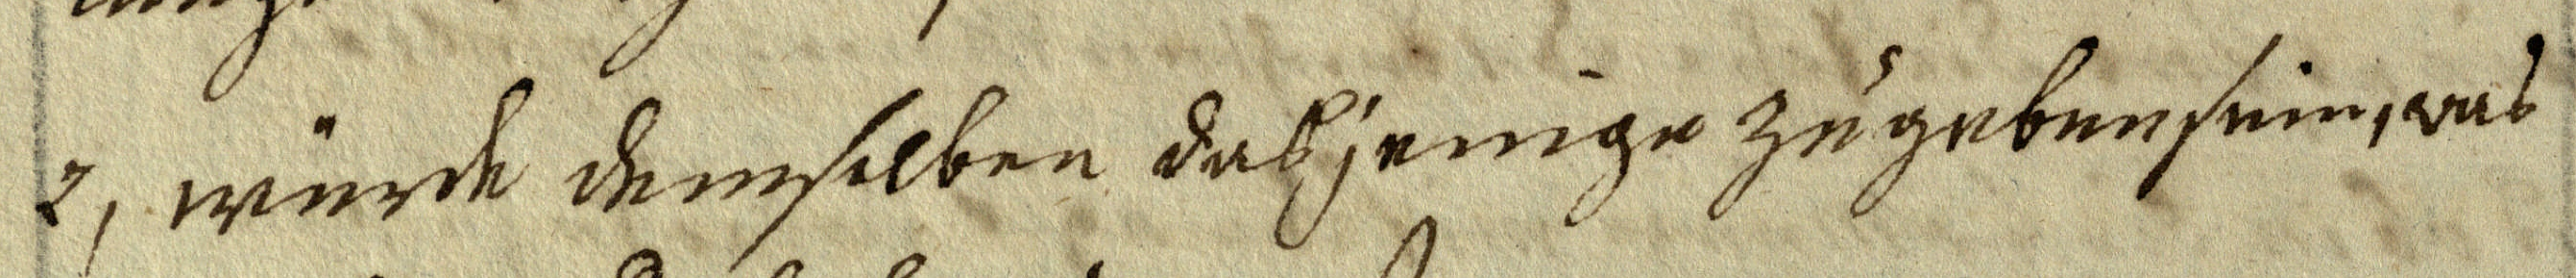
2, würde demselben dasjenige zu geben sein, was
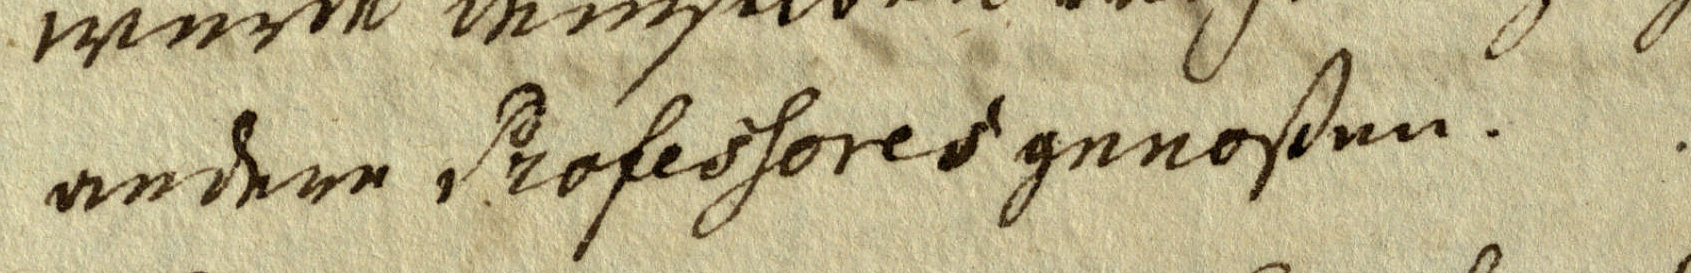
andere Professores genoßen.
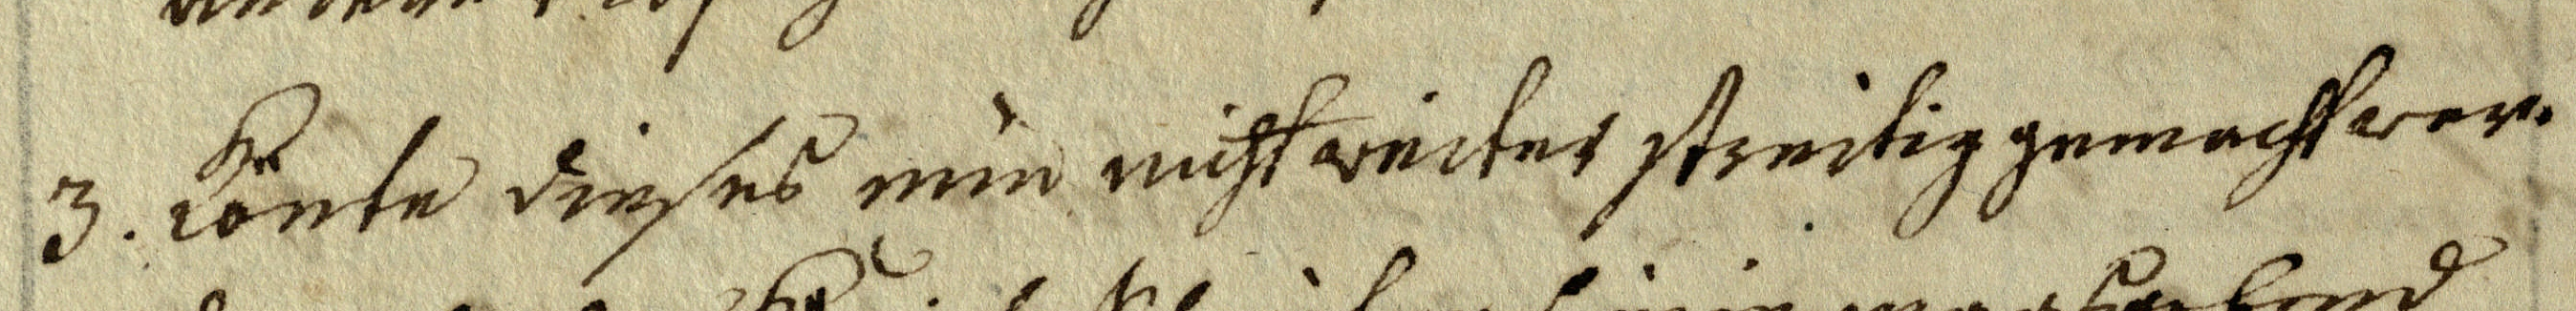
3. Könte dieses nun nicht weiter streitig gemacht wer¬
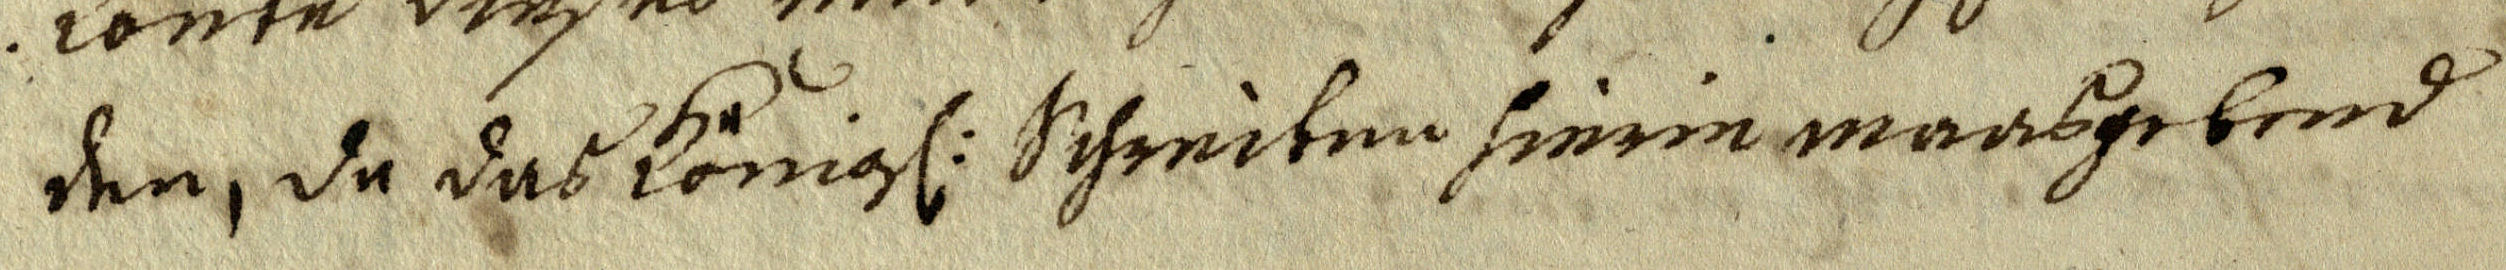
den, da das Königl. Schreiben hierin maasgebend
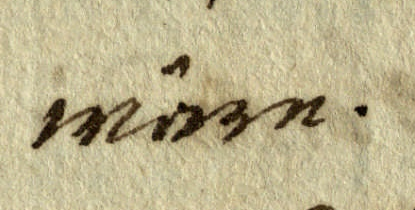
wäre.
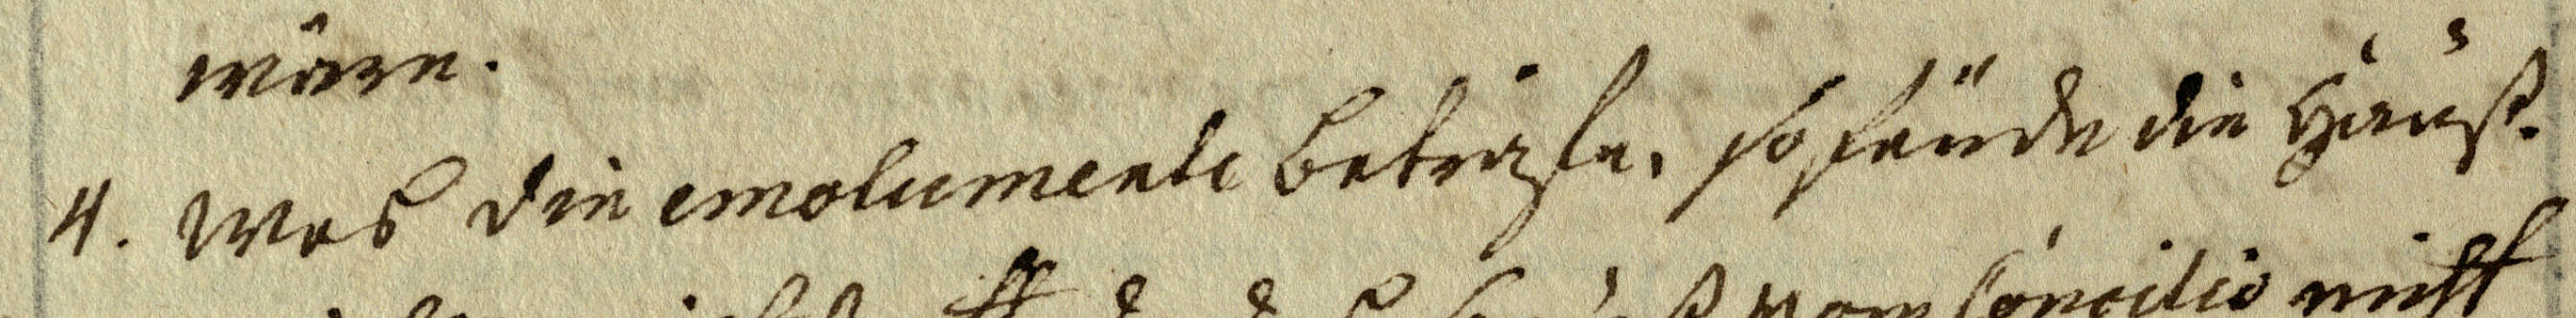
4. Was die emolumente beträfe, so fände die Haus¬
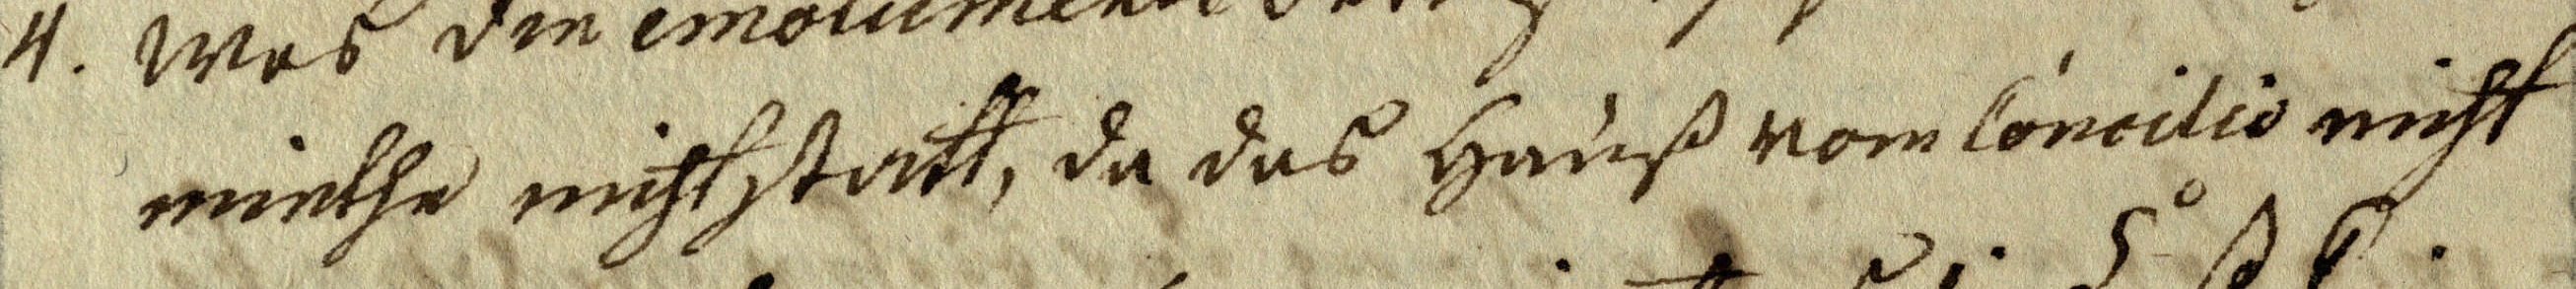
miethe nicht statt, da das Haus vom Concilio nicht
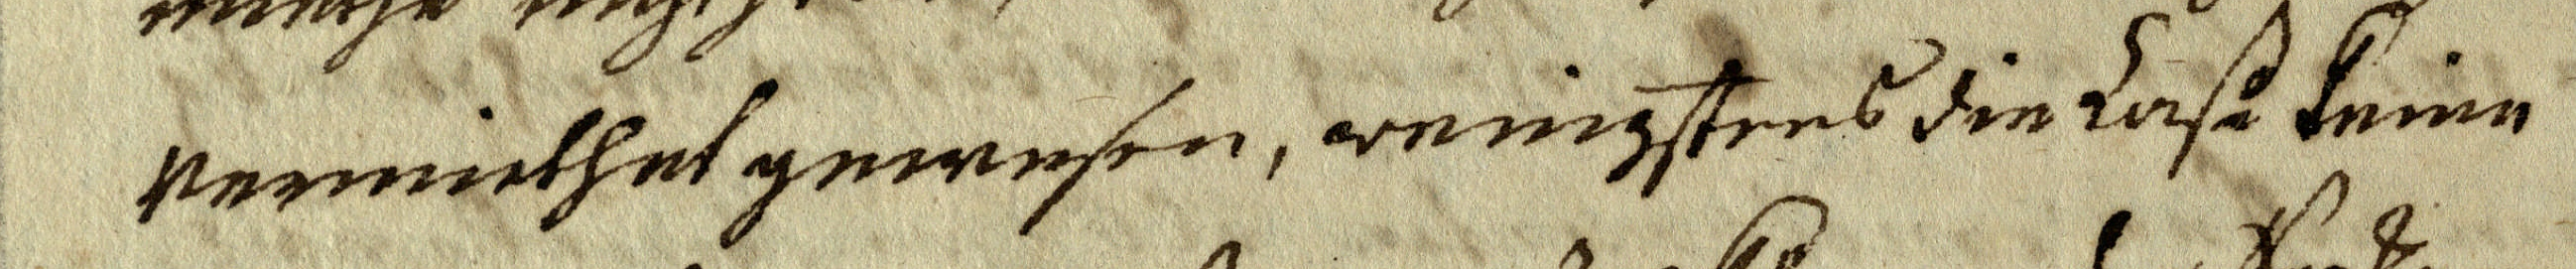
vermiethet gewesen, wenigstens die Caße keine
